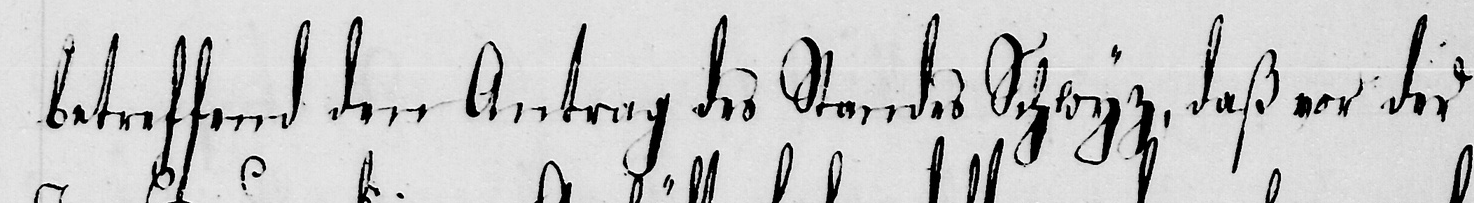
betreffend den Antrag des Standes Schwyz, daß vor der
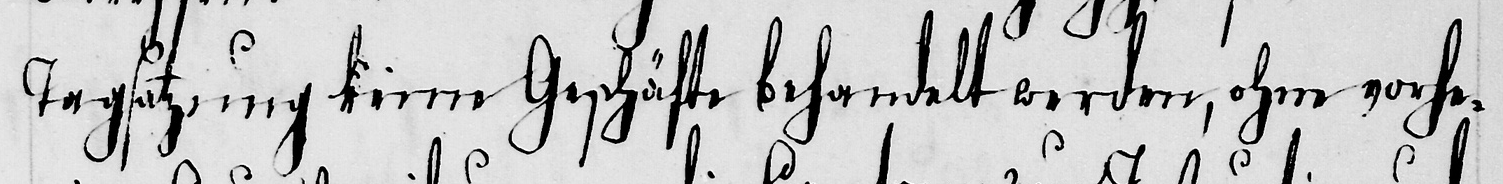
Tagsatzung keine Geschäfte behandelt werden, ohne vorhe¬
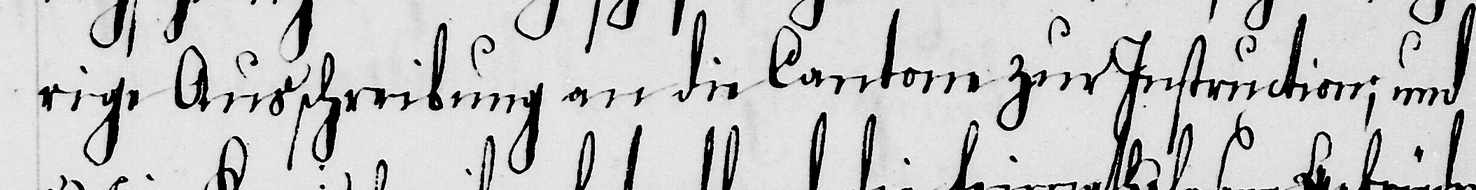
rige Ausschreibung an die Cantone zur Instruction; und
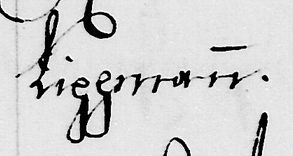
Lippmann.
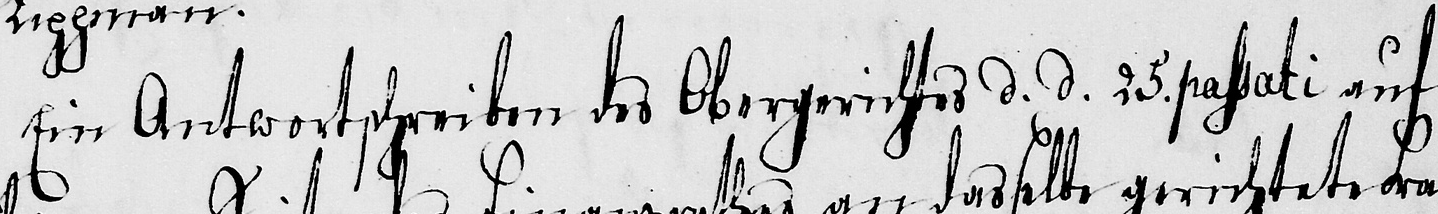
Ein Antwortschreiben des Obergerichtes d. d. 25. passati auf
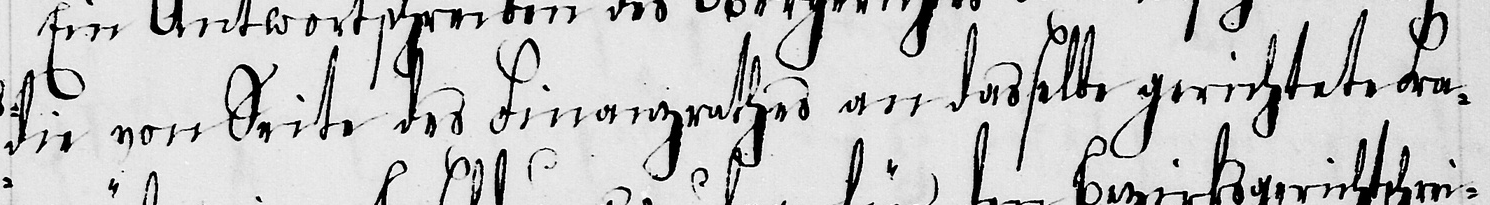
die von Seite des Finanzrathes an dasselbe gerichtete Fra¬
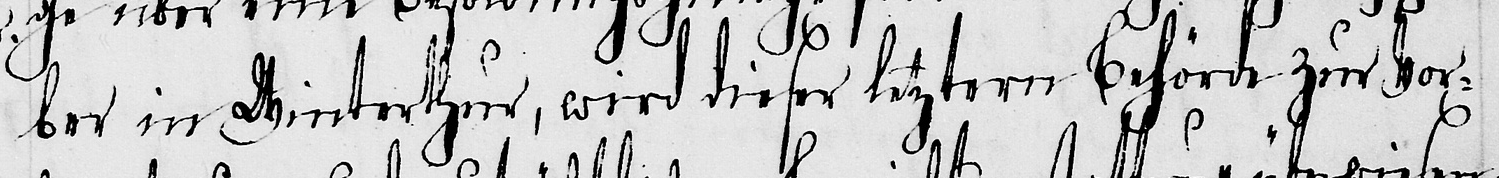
ber in Winterthur, wird dieser letztern Behörde zur Vor¬
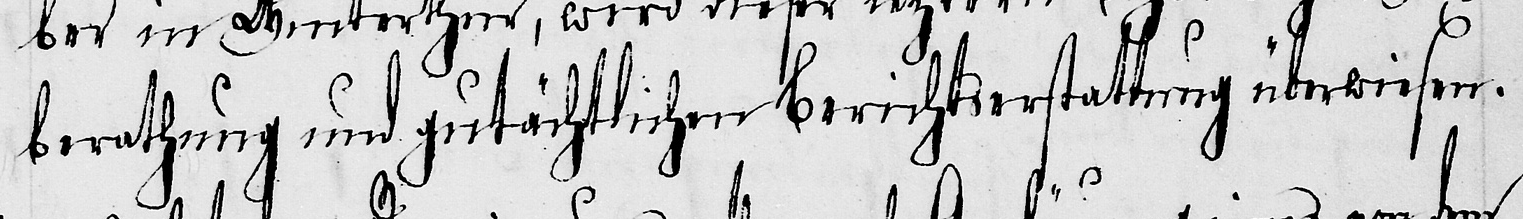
berathung und gutächtlichen Berichterstattung überwiesen.
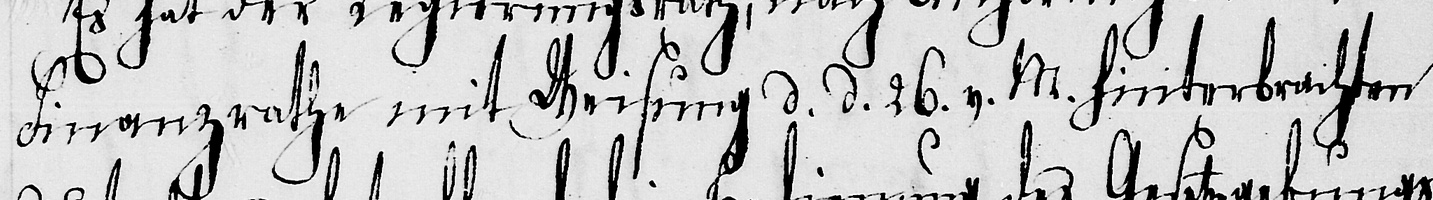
Finanzrathe mit Weisung d. d. 26. v. M. hinterbrachten
